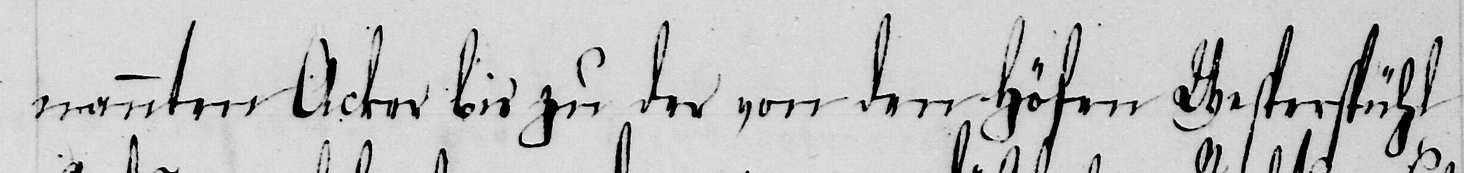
nannten Acker bis zu der von den Höfen Wesperspühl
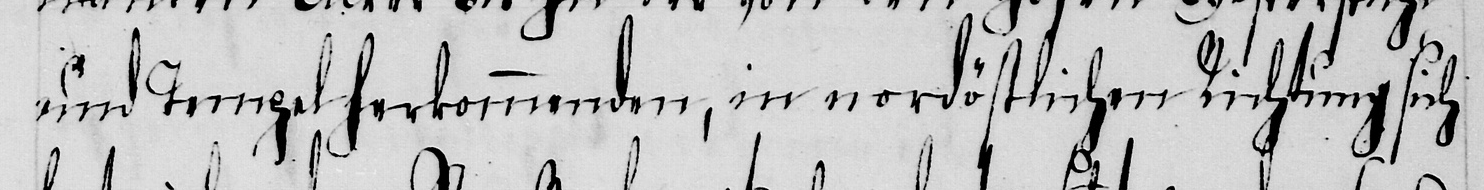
und Temgel herkommenden, in nordöstlichen Richtung sich
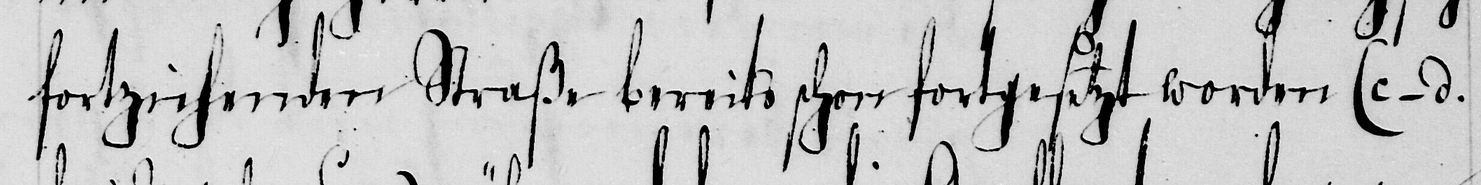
fortziehenden Straße bereits schon fortgesetzt worden (c–d.
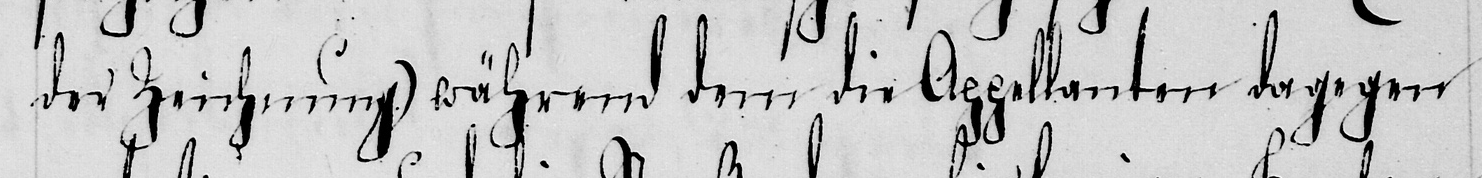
der Zeichnung) während dem die Appellanten dagegen
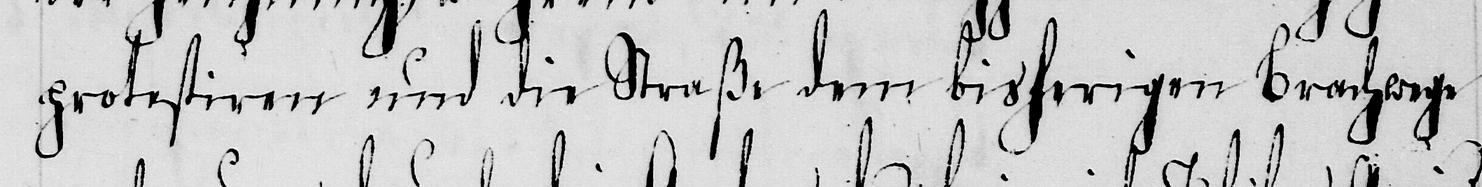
protestiren und die Straße dem bisherigen Brachwege
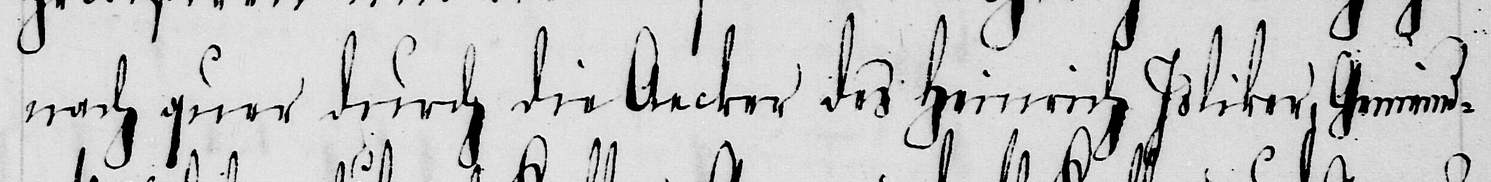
nach quer durch die Aecker des Heinrich Isliker, Geme¬
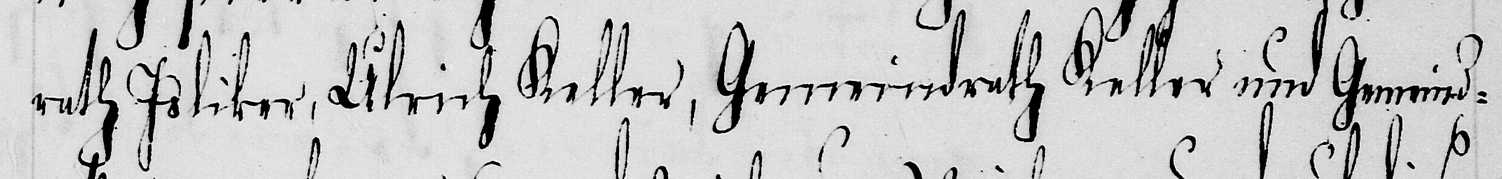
rath Isliker, Ulrich Keller, Gemeindrath Keller und Gemeind¬
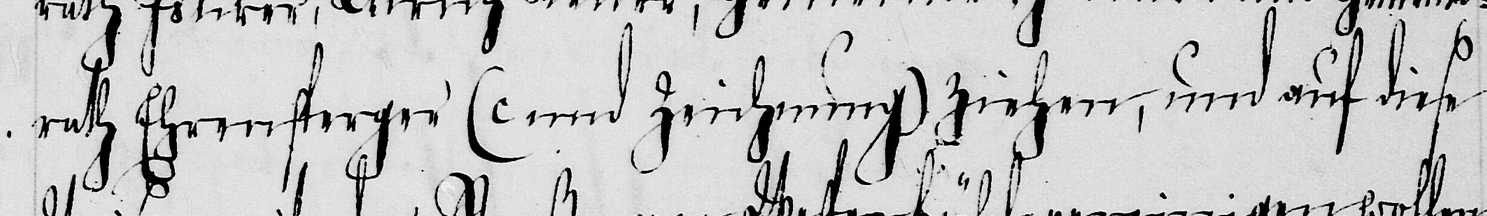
rath Ehrensperger (c und Zeichnung) ziehen, und auf diese
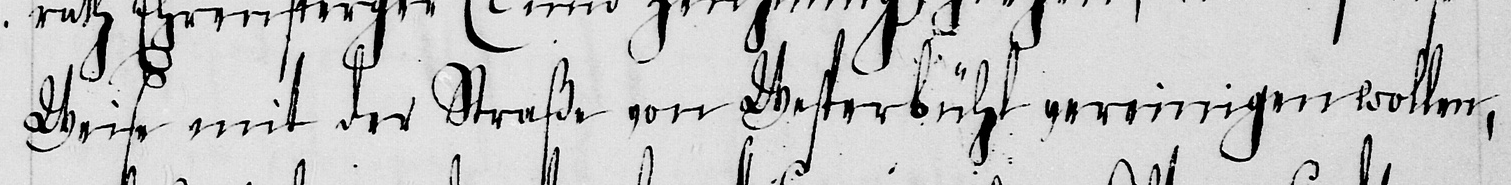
Weise mit der Straße von Wesperbühl vereinigen wollen,
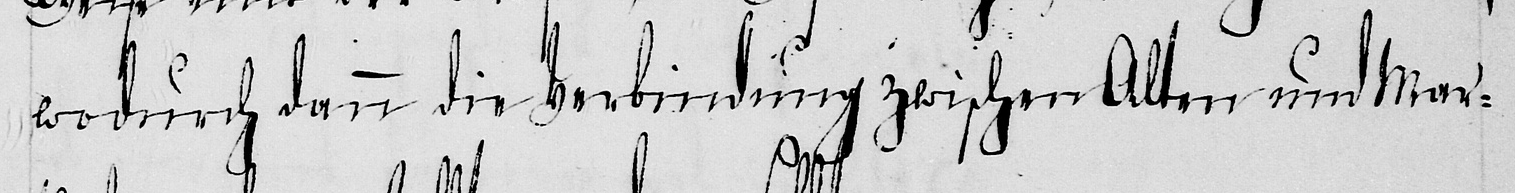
wodurch dann die Verbindung zwischen Alten und Mar¬
